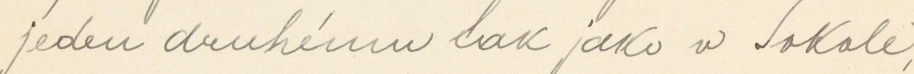jeden druhému tak jako v Sokole,
